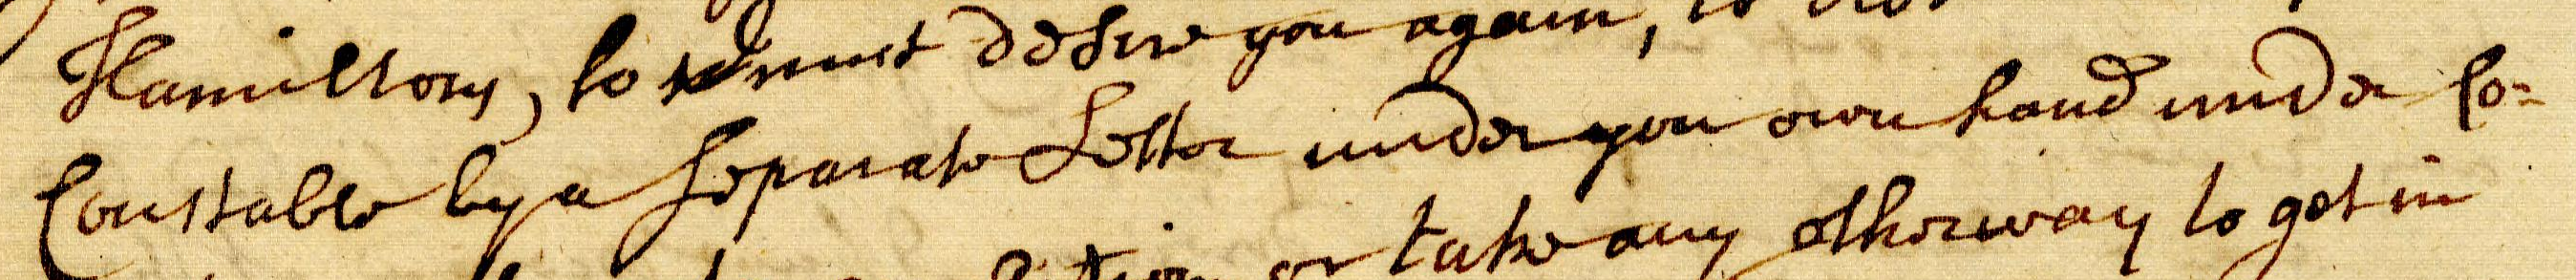Constable by a separate Letter under you own hand under Co-
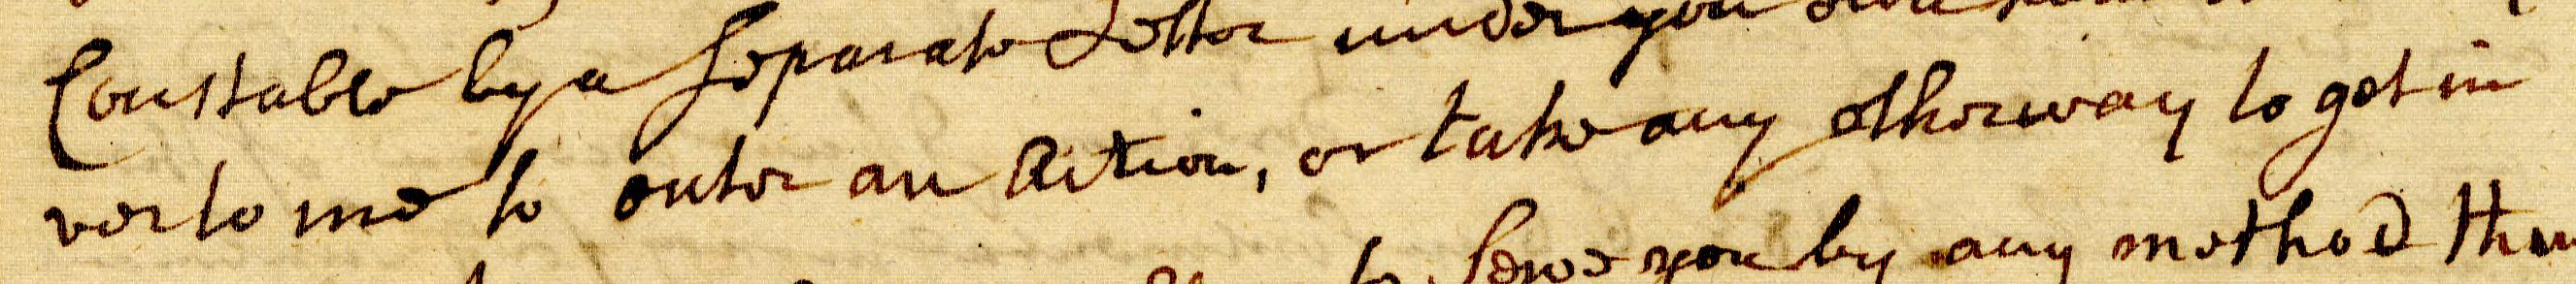ver to me to enter an Action, or take any otherway to get in
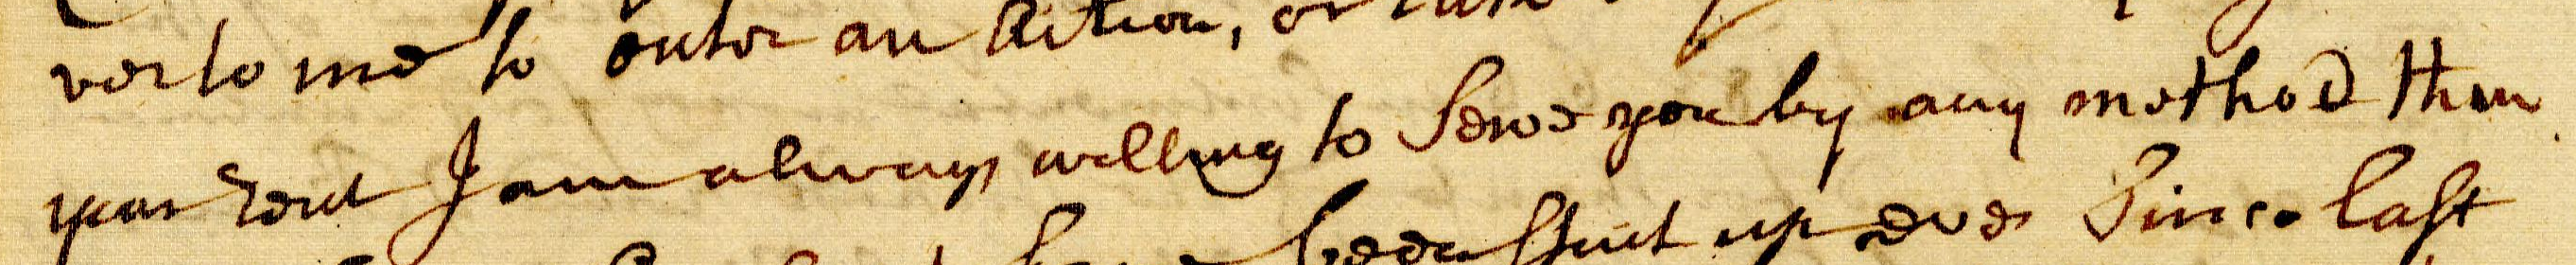your rent I am always willing to Serve you by any method than
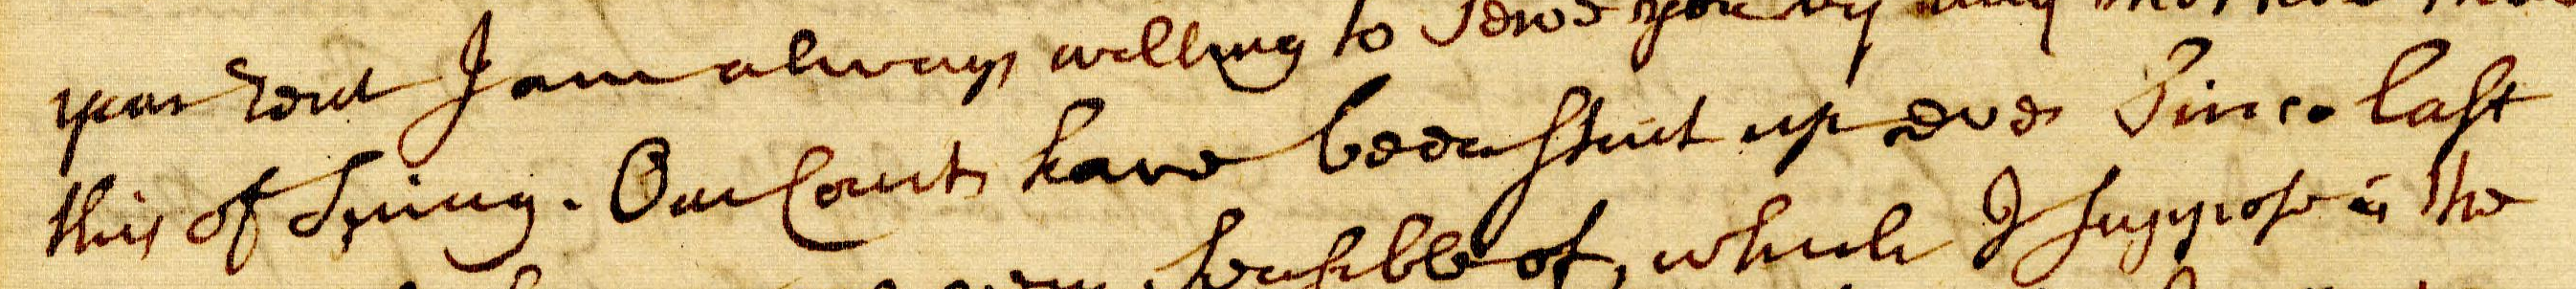this of Suing. Our Courts have been Shut up ever Since last
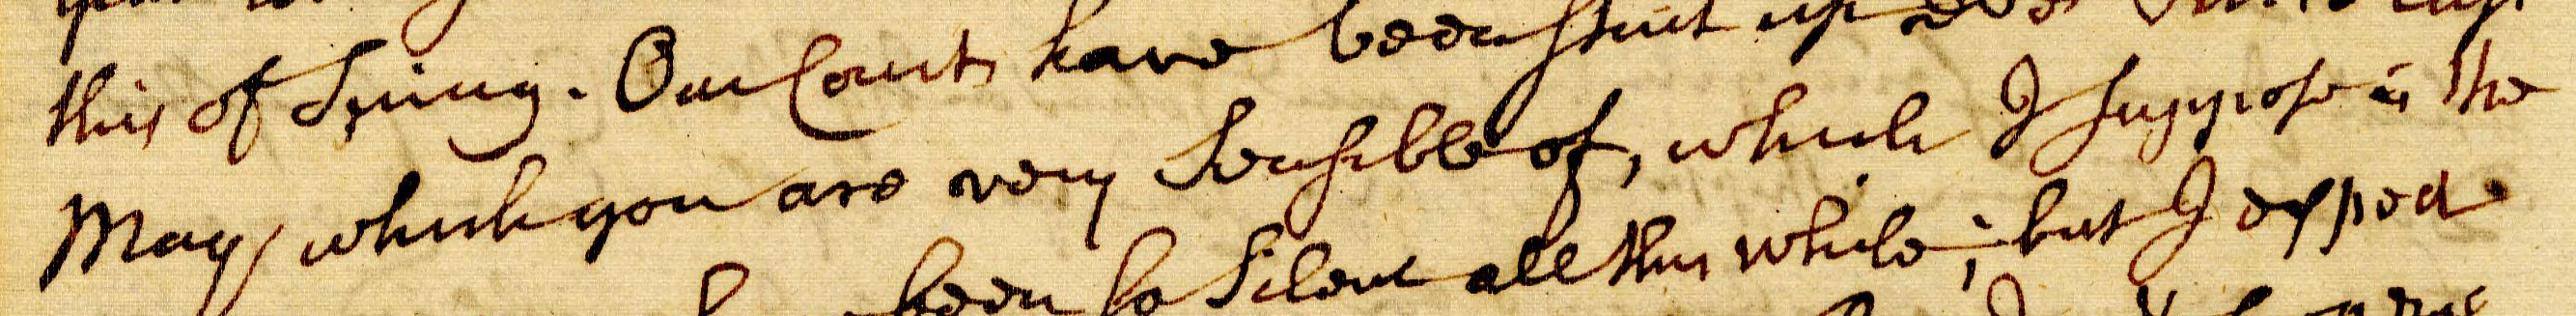May which you are very Sensible of, which & suggest is the
